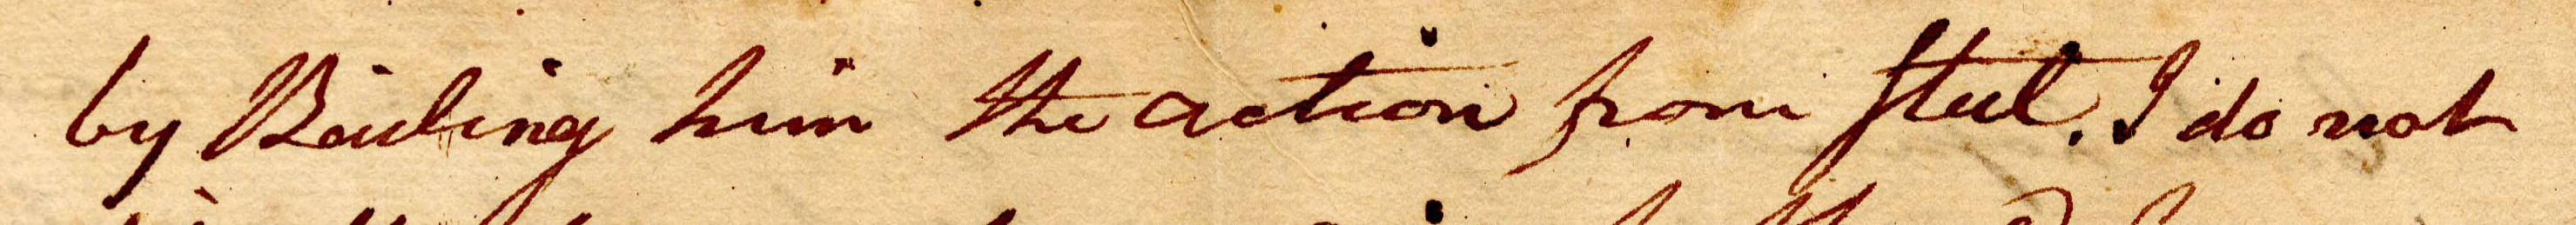by Bailing him the action from Stul, I do not
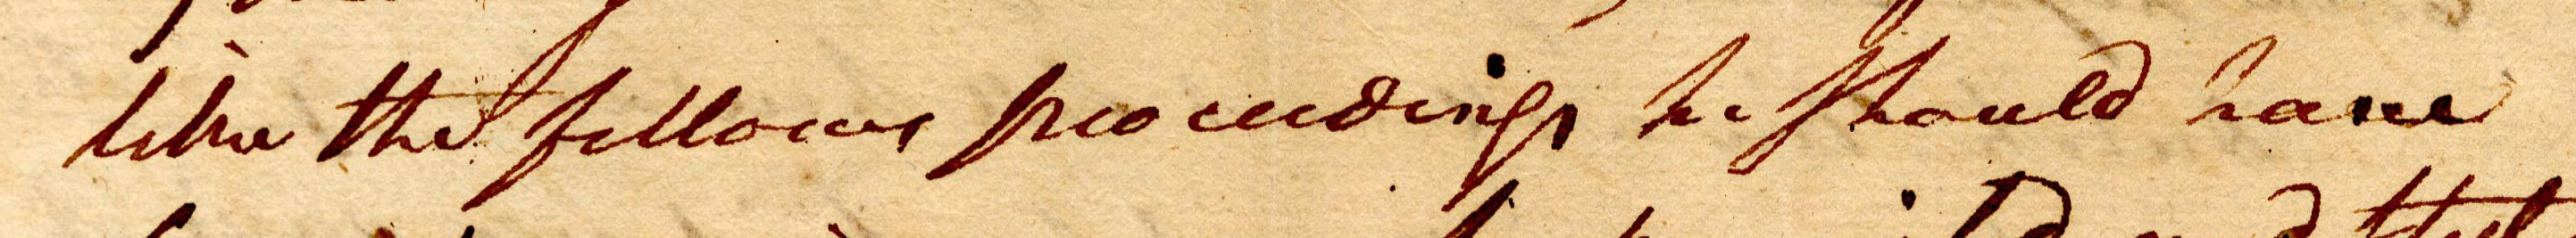like the fellows proceedings he should have
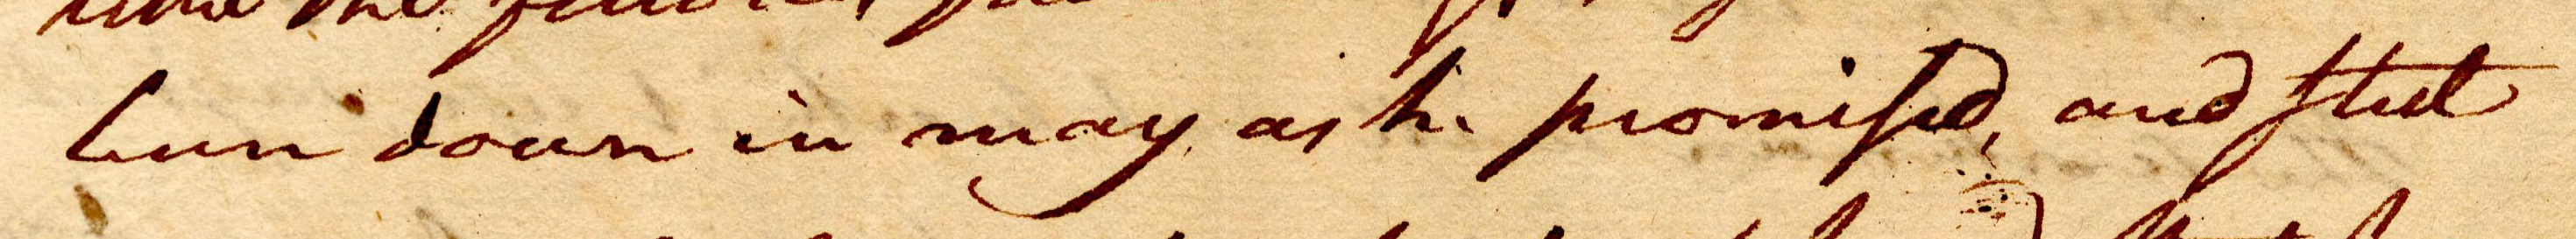come down in may as he promised, and stul
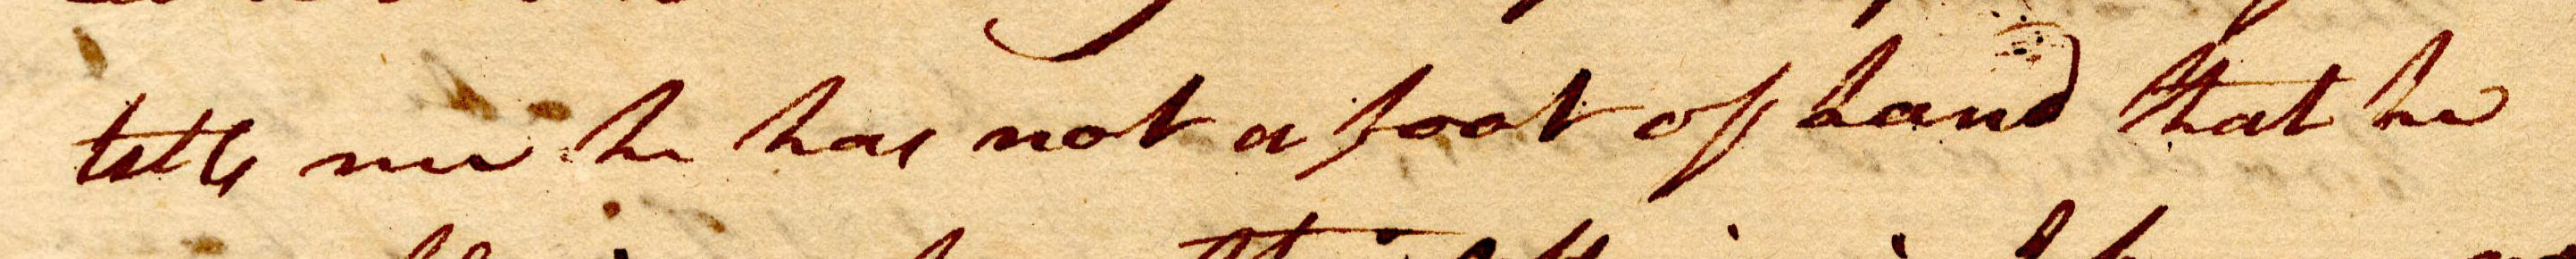tells me he has not a foot of Land that he
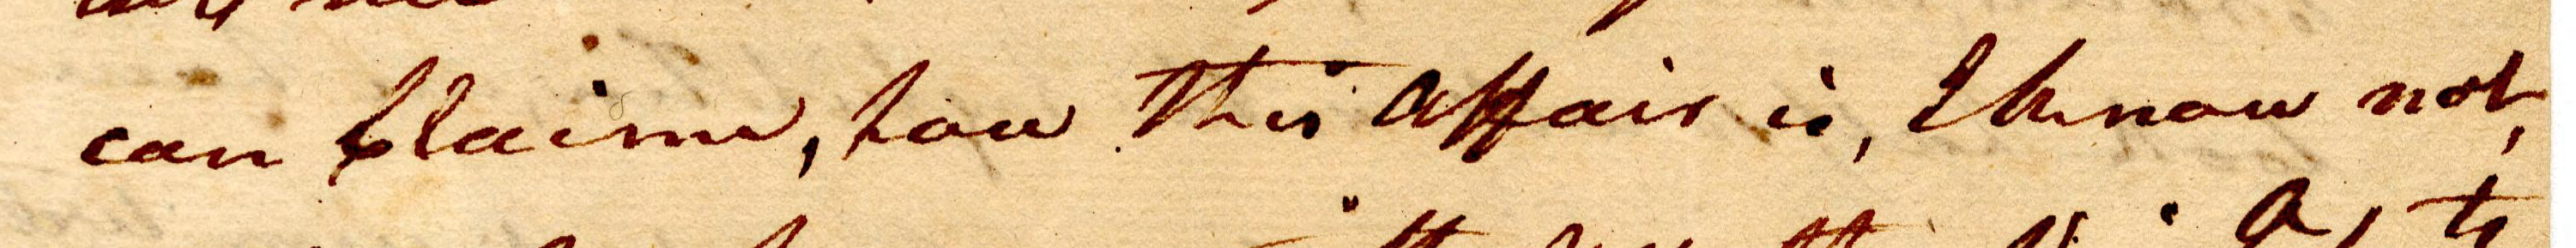can Claime, how this Affair is, I know not,
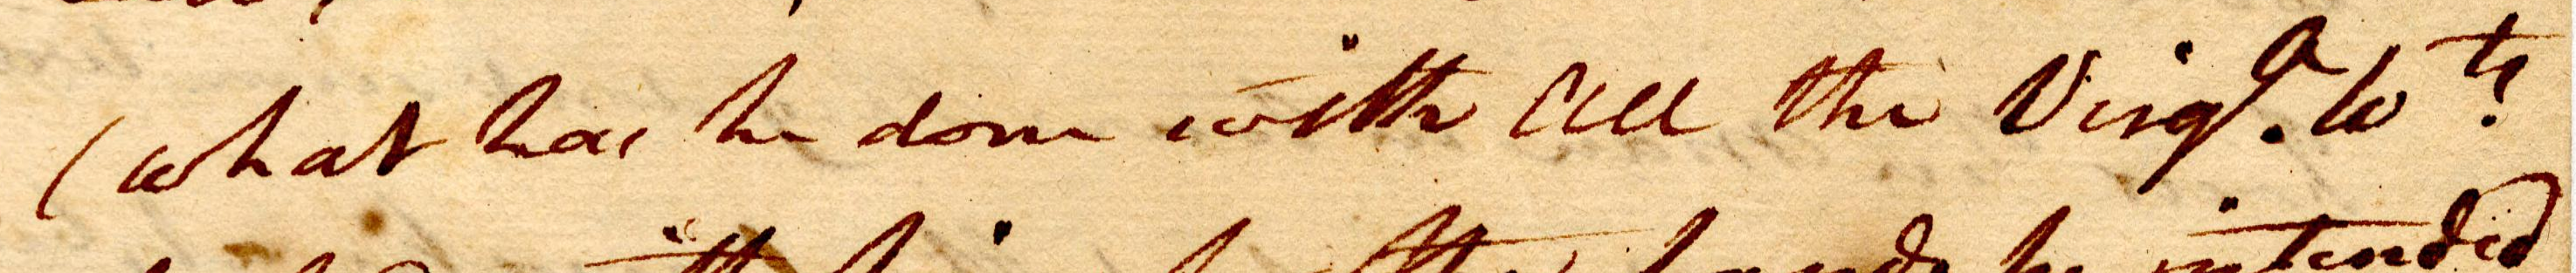(what has he done with All the Virg^a. lo^t
